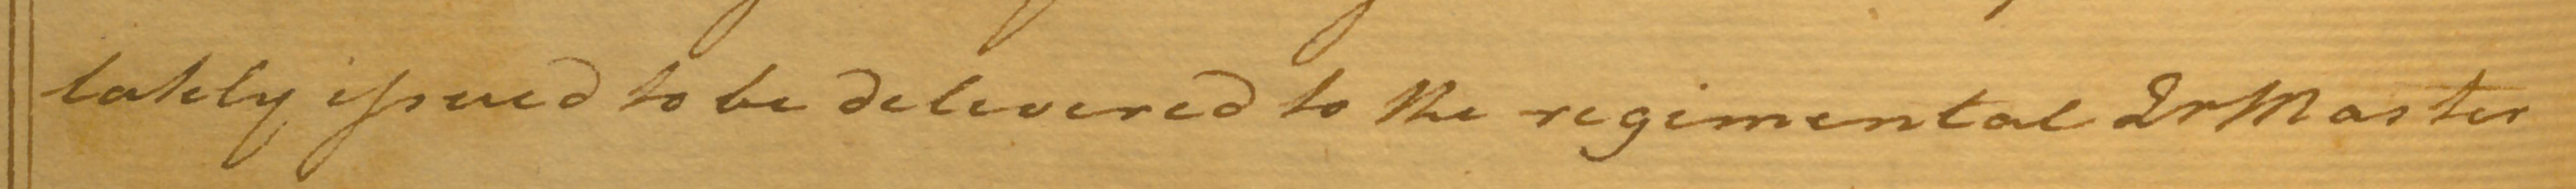lately issued to be delivered to the regimental Qr Master
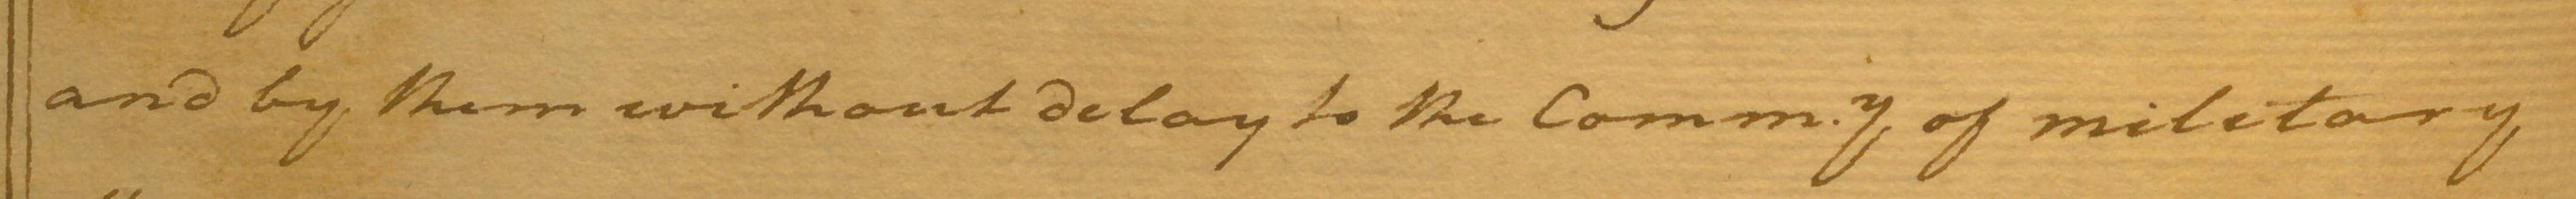and by them without delay to the Comm^y. of military
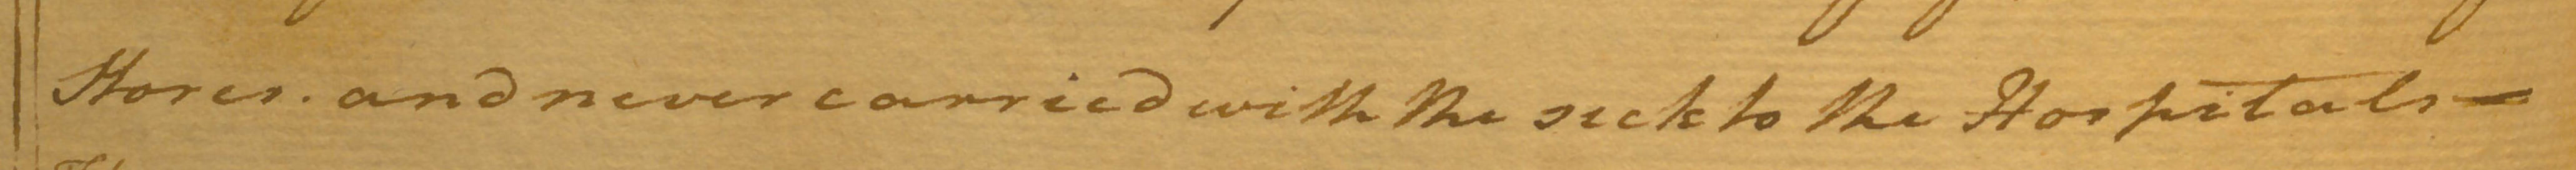Stores and never carried with the sick to the Hospitals-
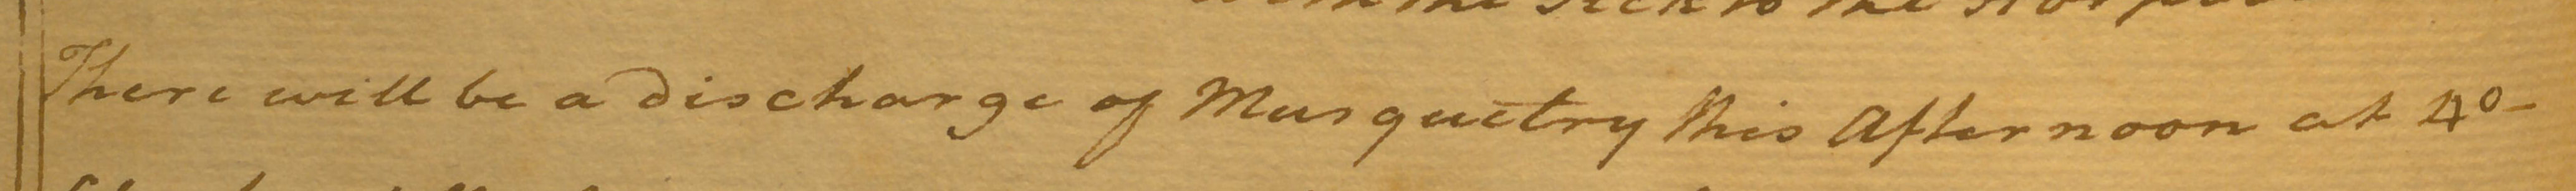There will be a discharge of Musquetry this Afternoon at 4 ^o
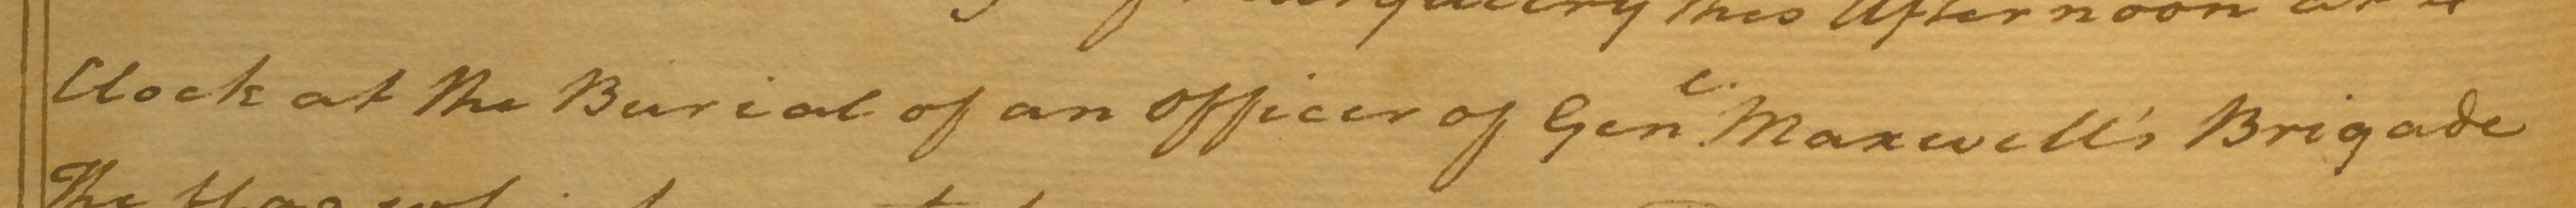Clock at the Burial of an Officer of Gen^l. Maxwell's Brigade
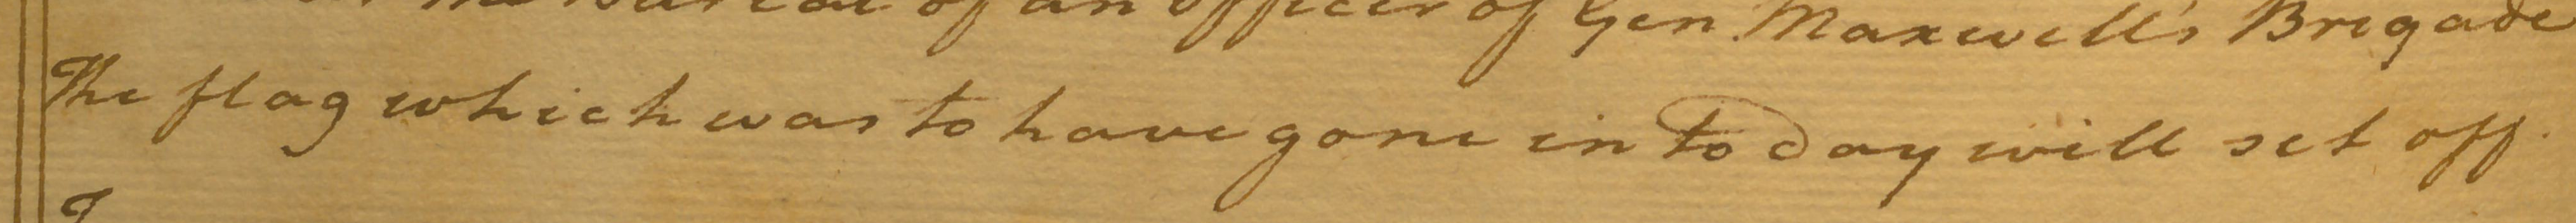The flag which was to have gone in today will set off
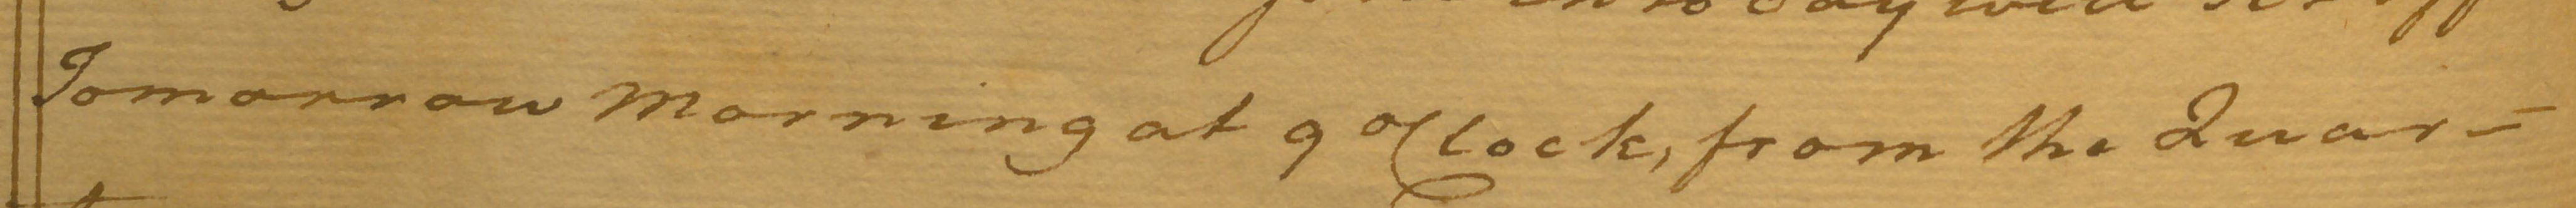Tomorrow morning at 9 ^oClock, from the Quar-
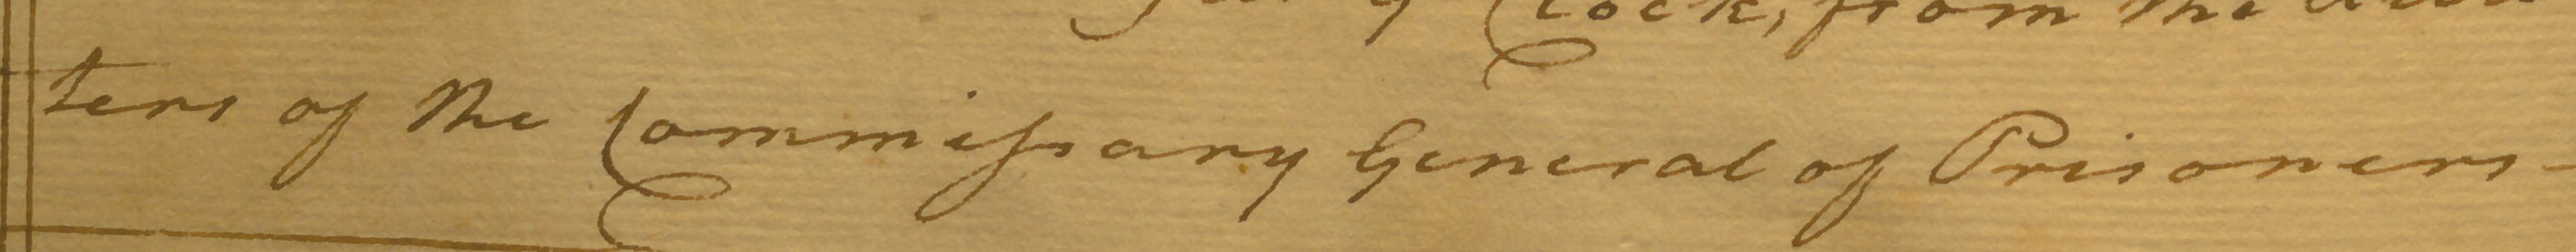ters of the Commisary General of Prisoners
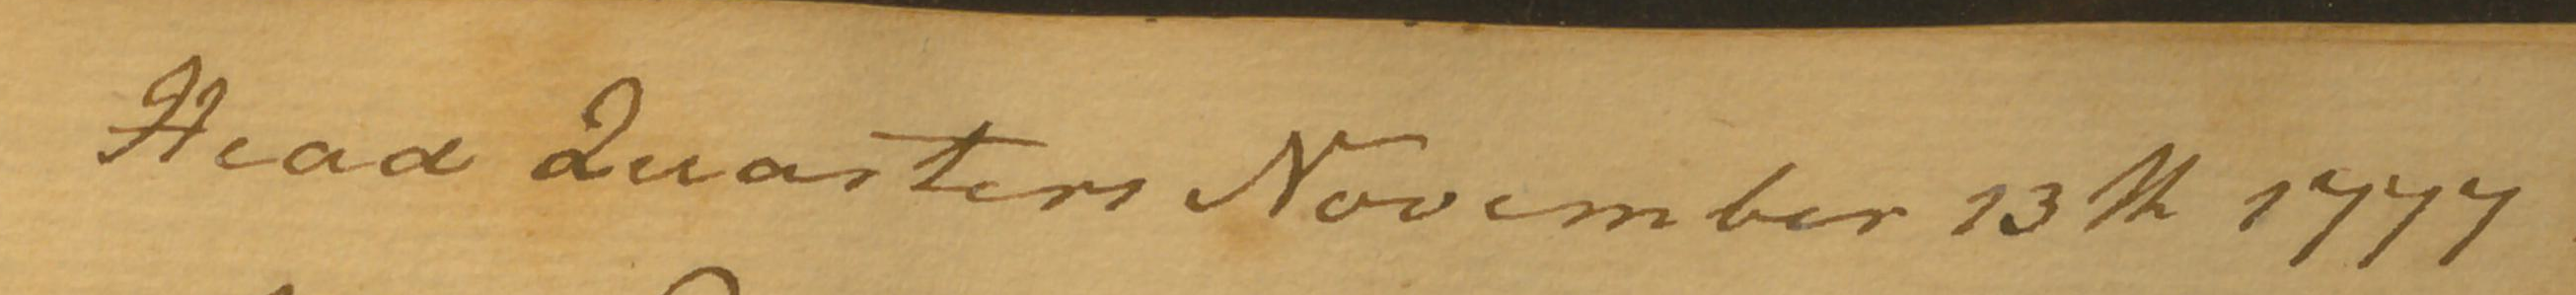Head Quarters November 13th 1777
